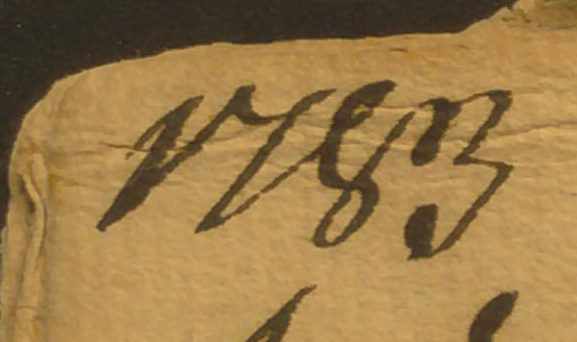1783
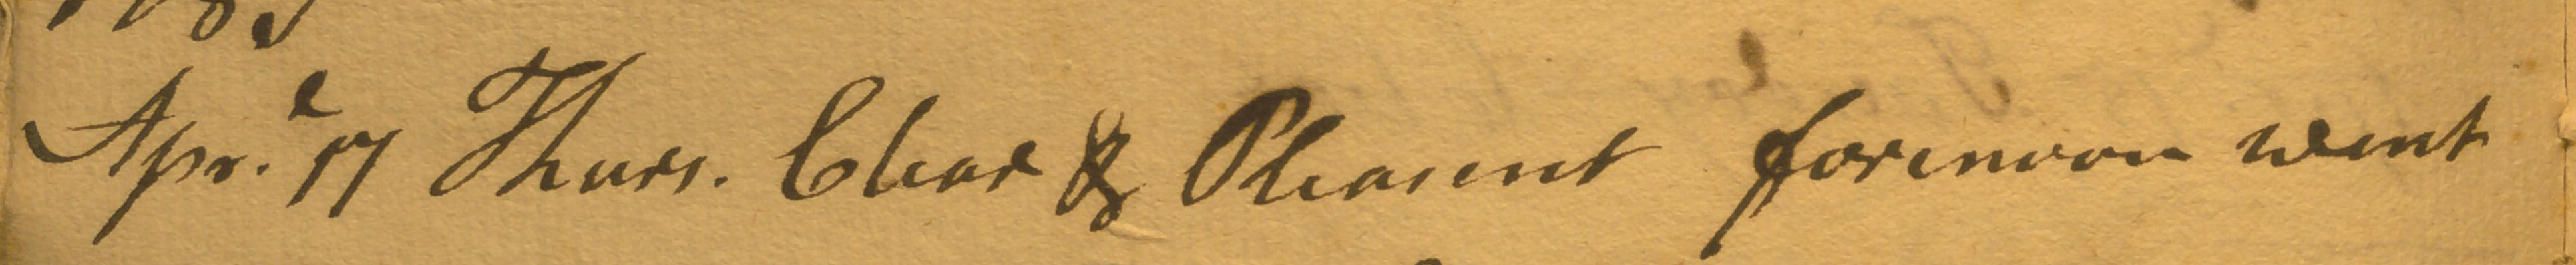Apr^l. 17 Thurs. Clear & Pleasent forenoon went
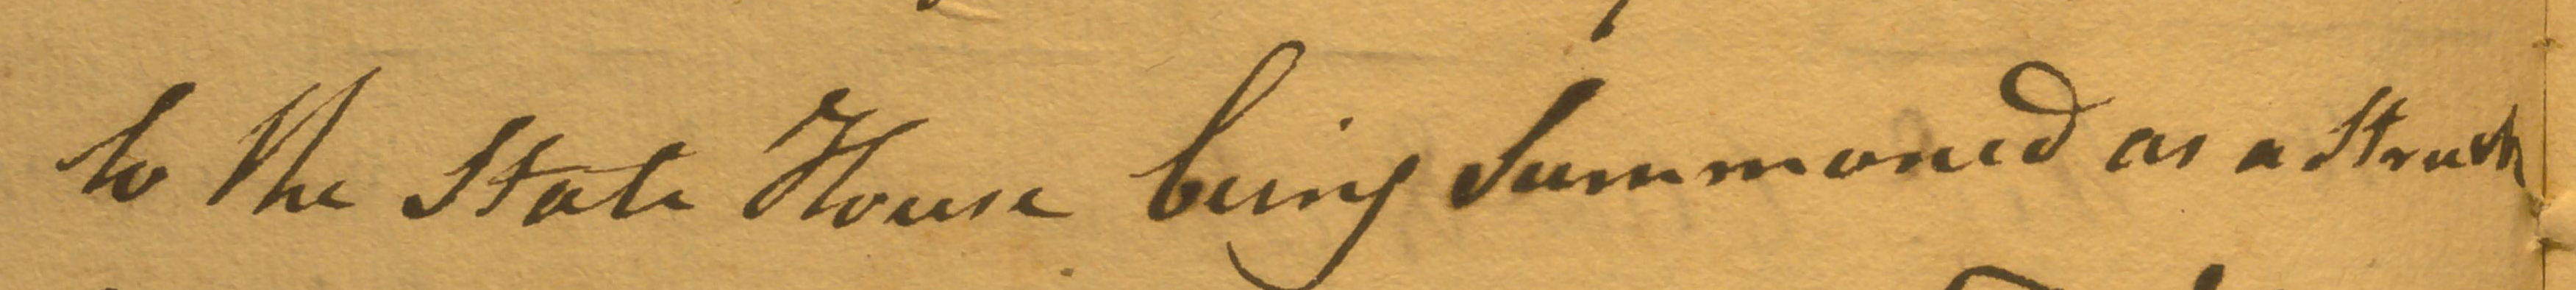to the State House being Summoned as a Stret
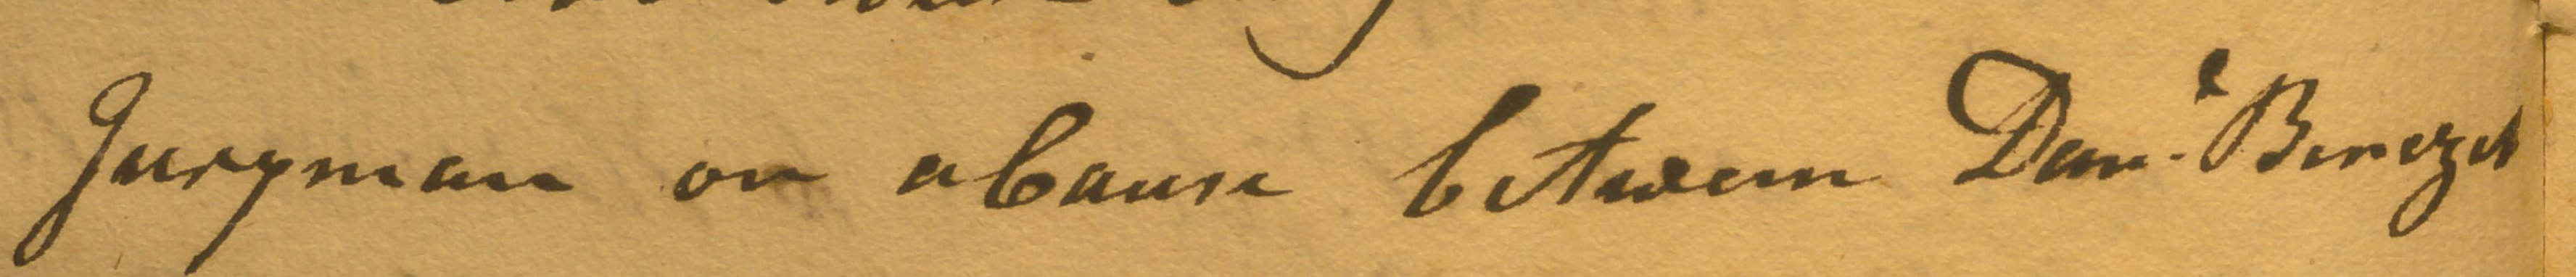Juryman on a Cause between Dan^l. Benezet
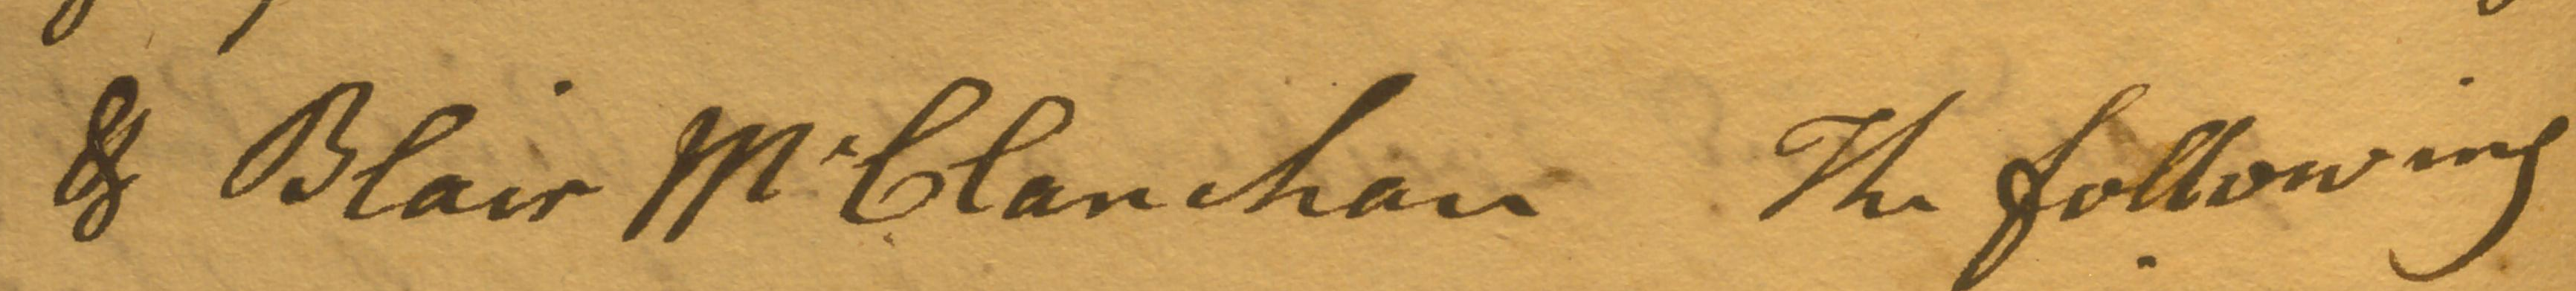& Blair M^cClanchan The following
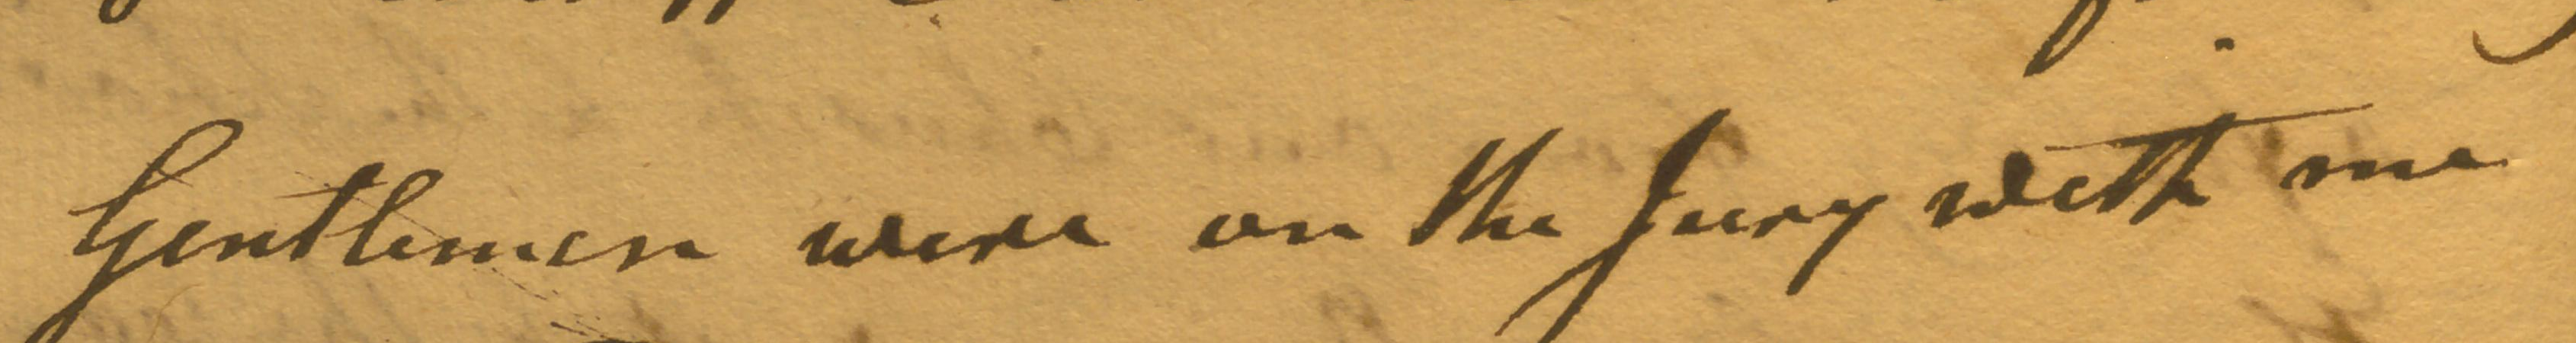Gentlemen were on the Jury with me
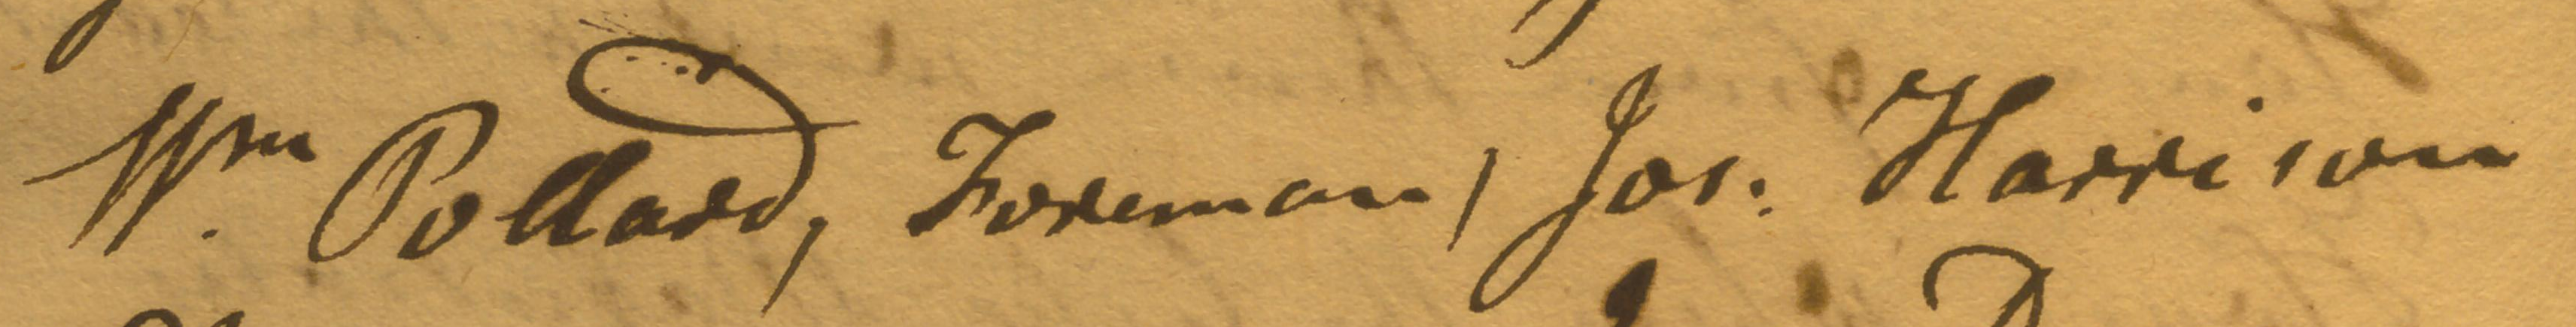W^m. Pollard, Foreman, Jos. Harrison
